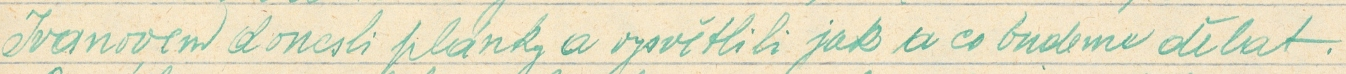Ivanovem donesli plánky a vysvětlili jak a co budeme dělat.
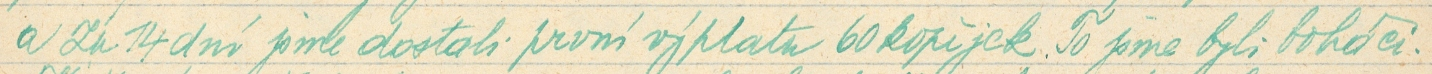a za 14 dní jsme dostali první výplatu 60 kopějek. To jsme byli boháči.
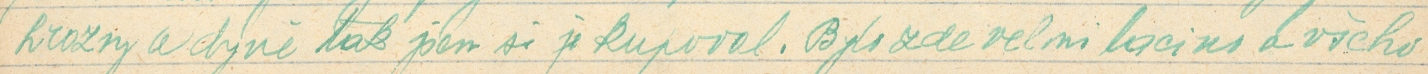hrozny a dyně tak jsem si je kupoval. Bylo zde velmi lacino a všeho
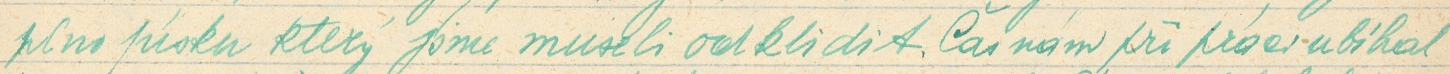plno písku který jsme museli odklidit. Čas nám při práci ubíhal
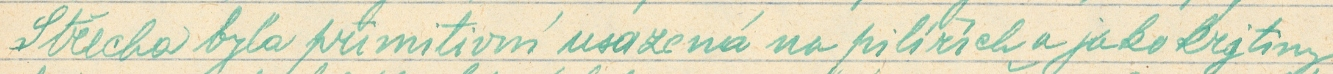Střecha byla primitivní usazená na pilířích a jako krytiny
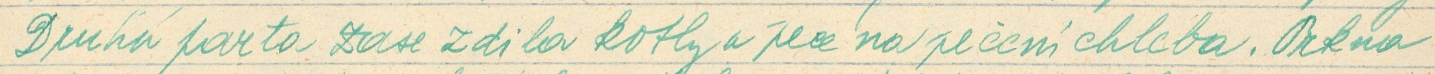Druhá parta zase zdila kotly a pece na pečení chleba. Prkna
